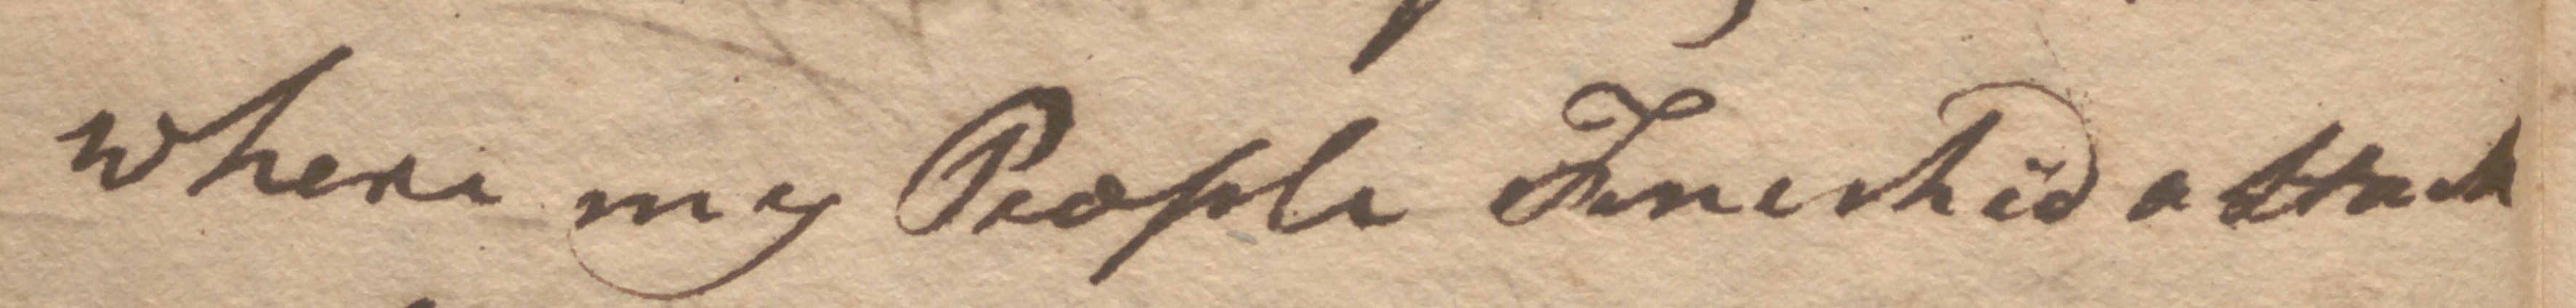where my People Finished a Stack
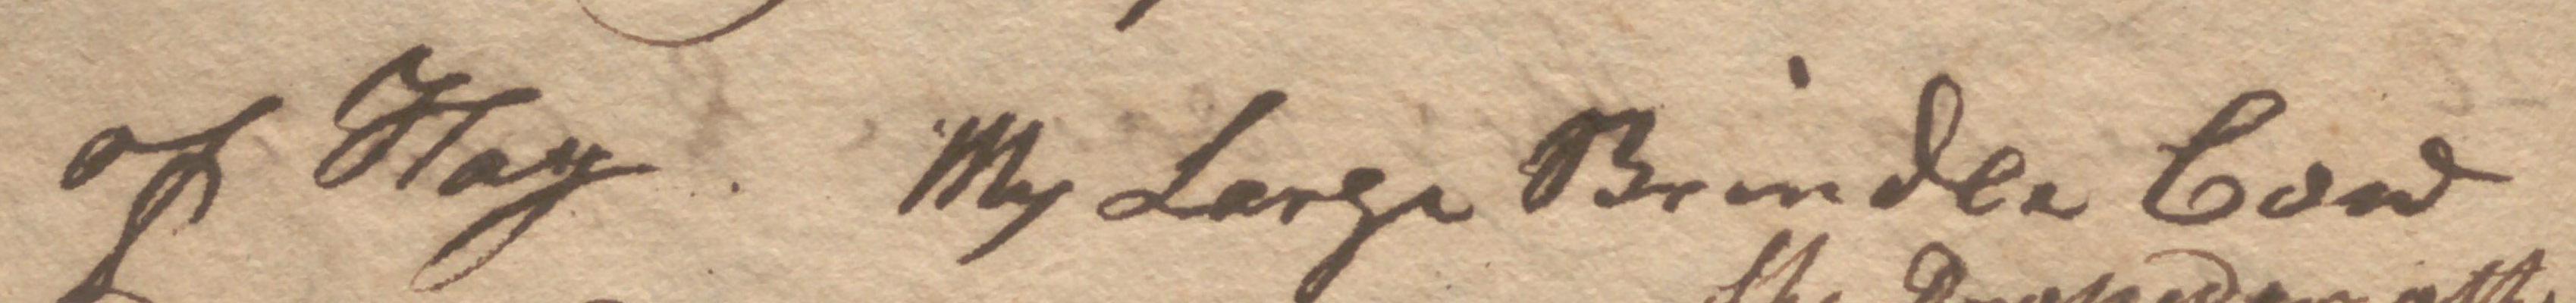of Hay. My Large Brindle Cow
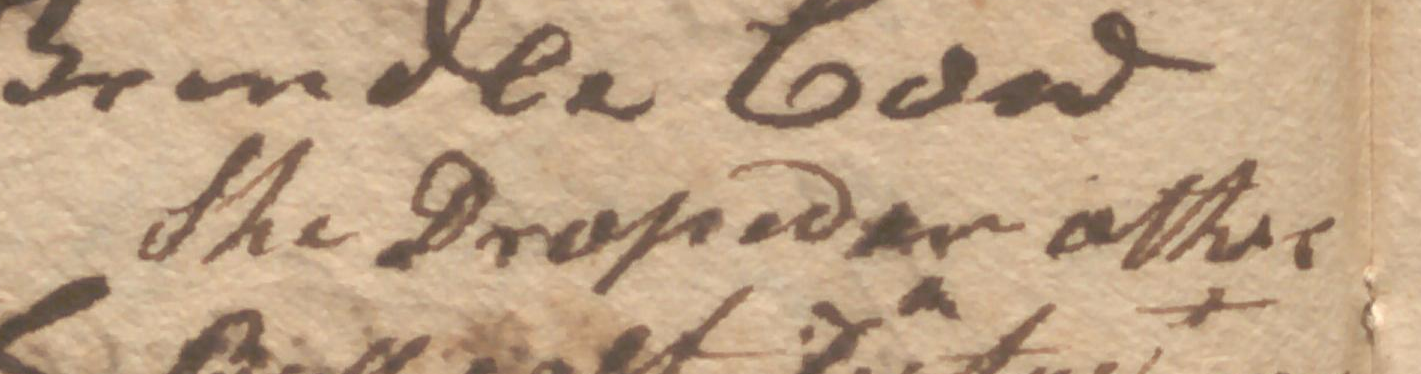she Droped an other
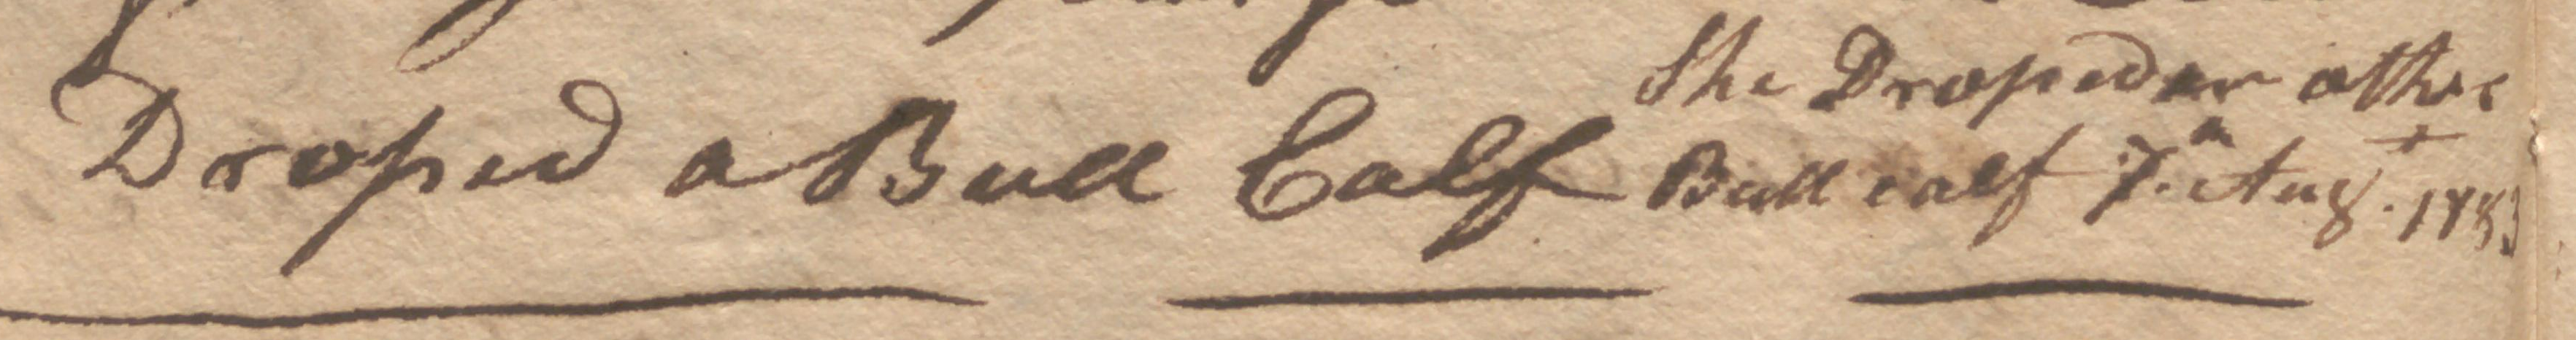Droped a Bull Calf Bull calf 7 Aug^t. 1783
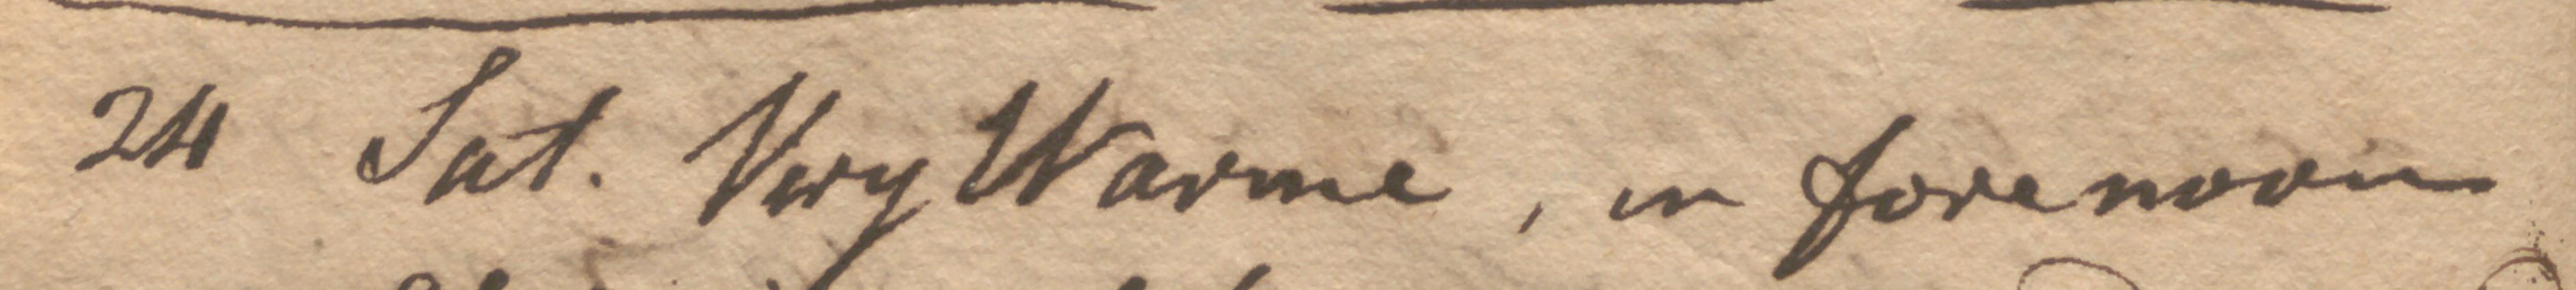24 Sat. Very Warme, in forenoon
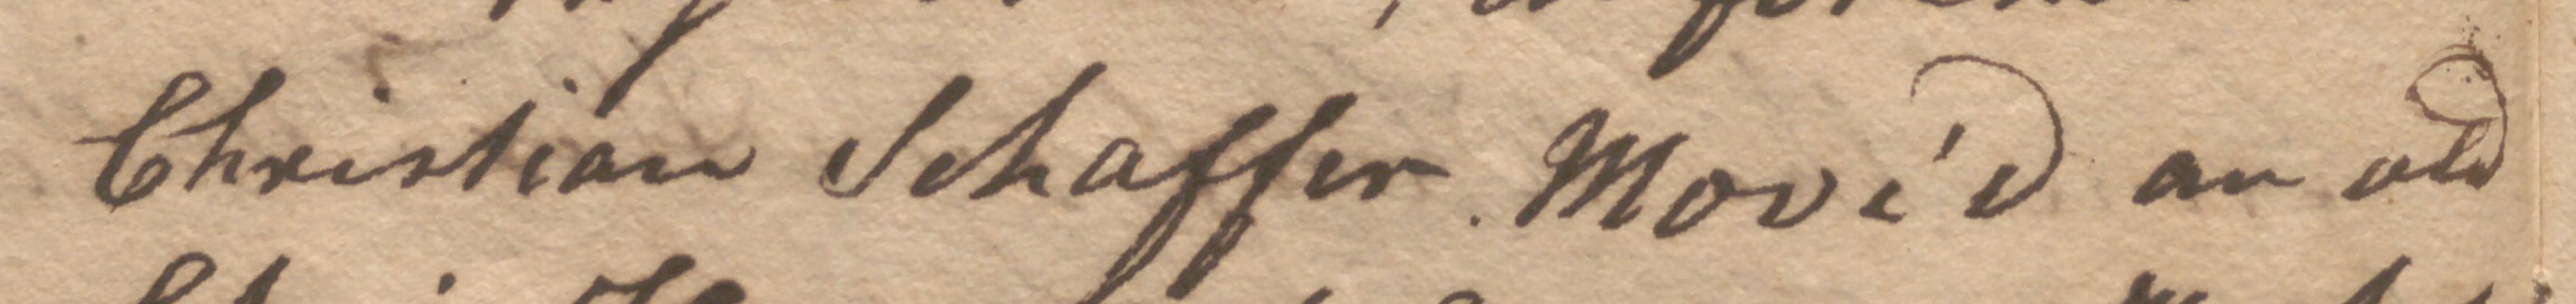Christian Schaffer Move'd an old
